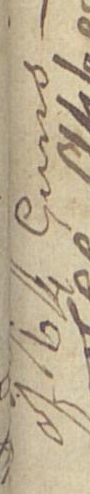Of 164 Guns
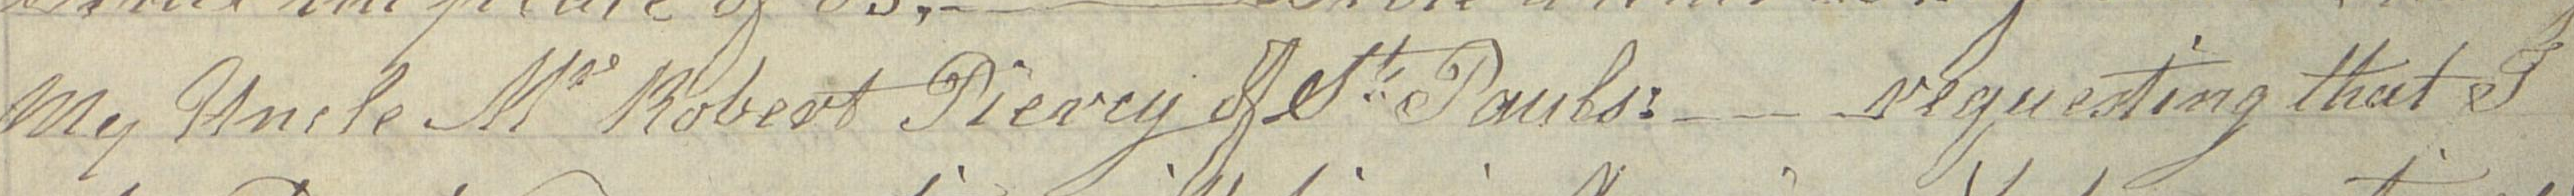My Uncle M^r Robert Piercy of S^t. Pauls: requesting that I
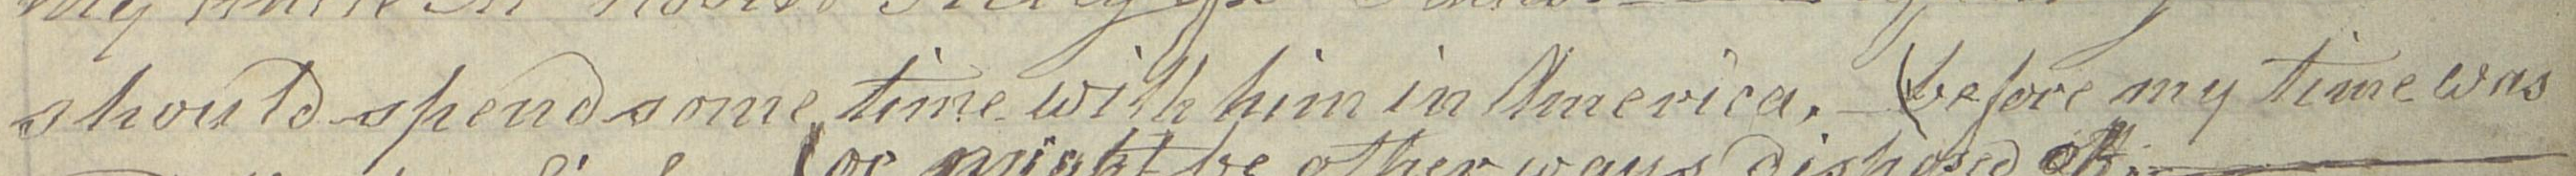should spend some time with him in America, (before my time was
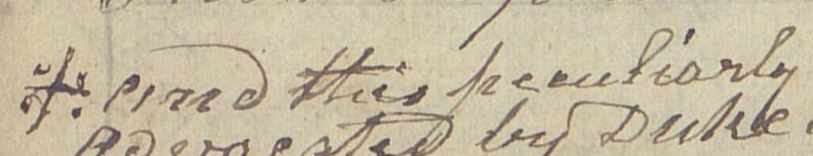and this peculiarly
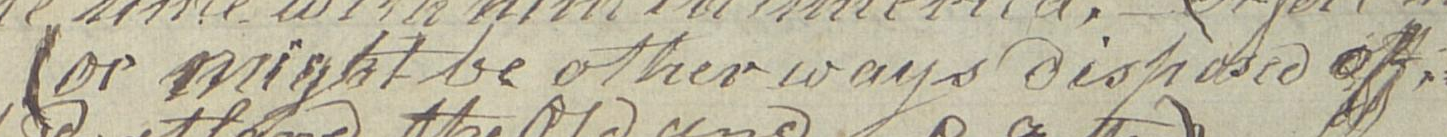(or might be other ways disposed off
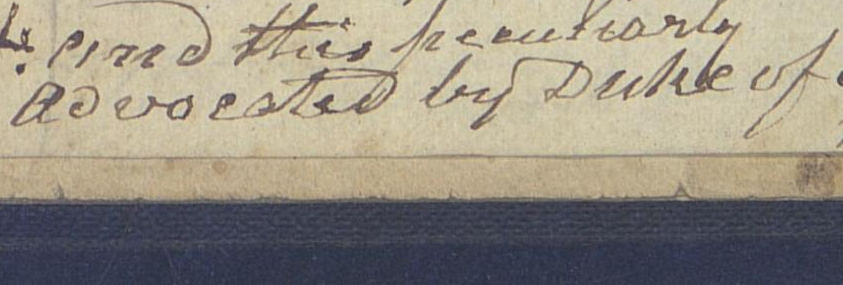advocated by Duke of
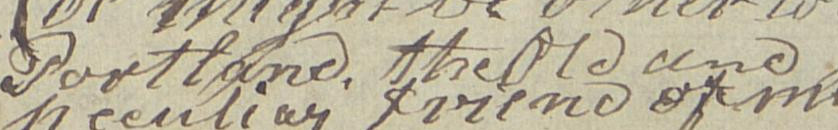Portland, the old and
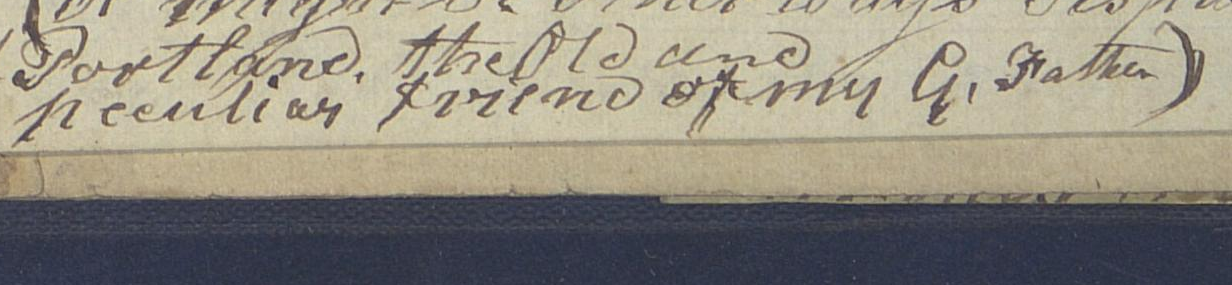peculiar friend of my G. Father)
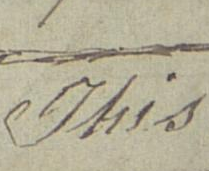This.
